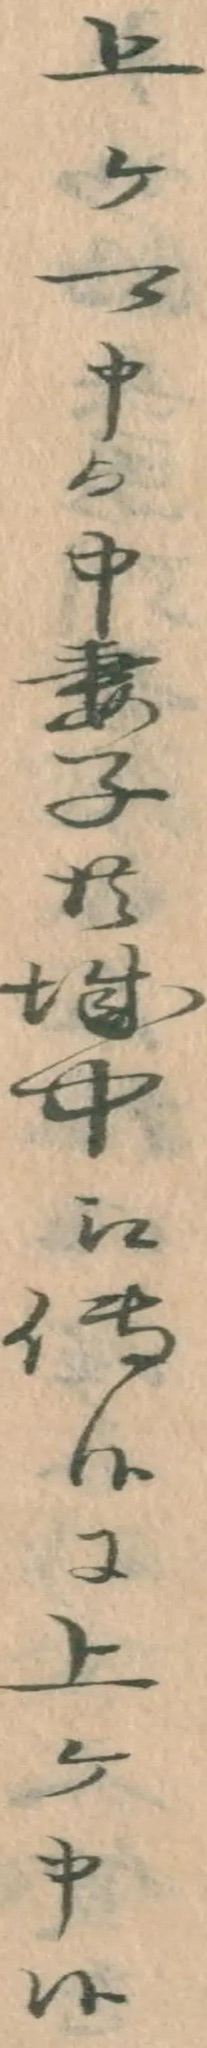上け可申与申妻子共城中え伝候に上け申候
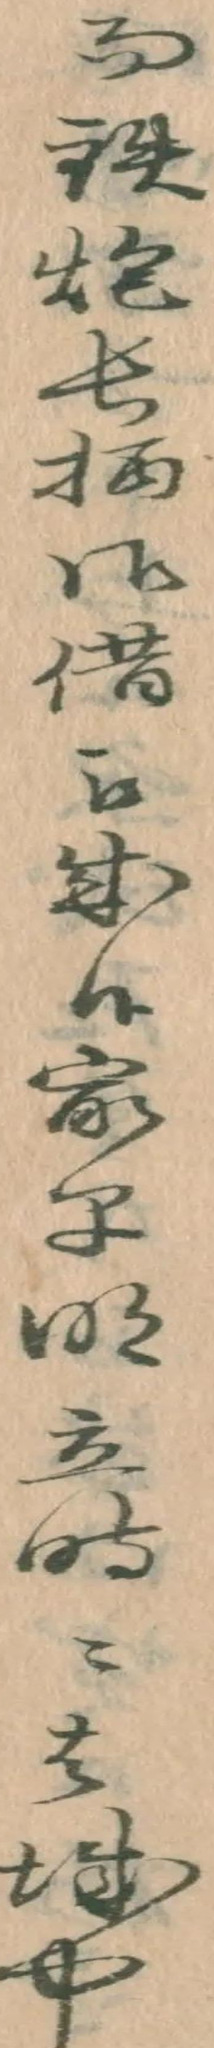而鉄炮長柄御借被成候最早明立時には城中
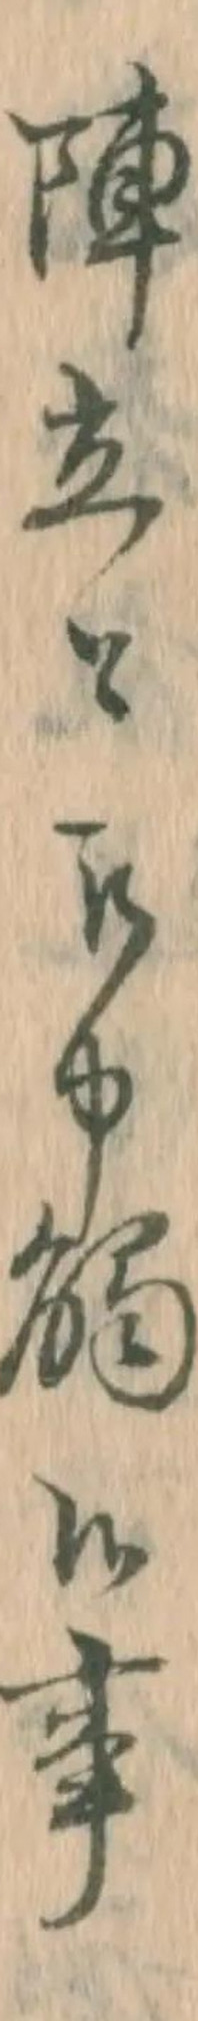陣立と被申触候事
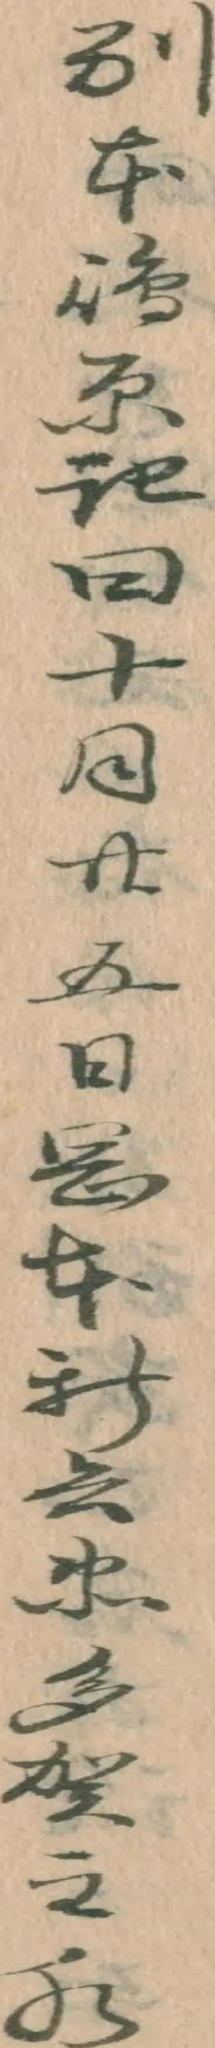別本島原記日十月廿五日岡本新兵衛多賀主水
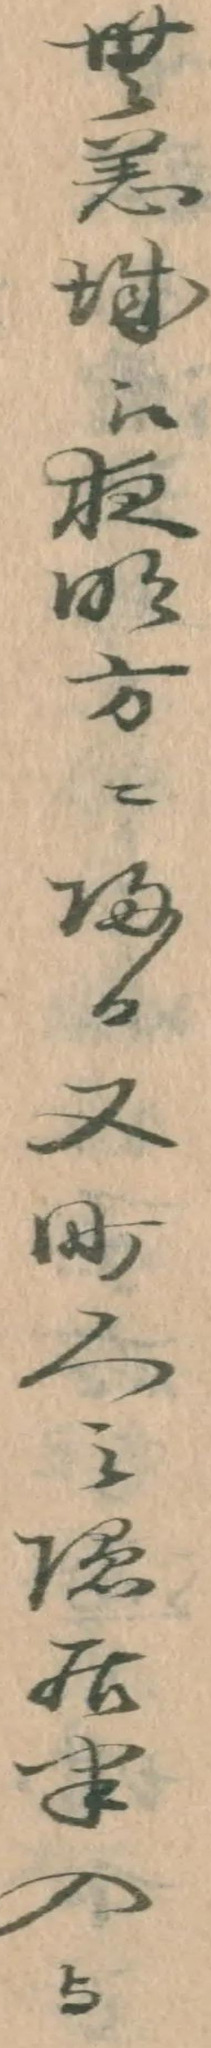無恙城え夜明方に帰る又町人之隠居半入与
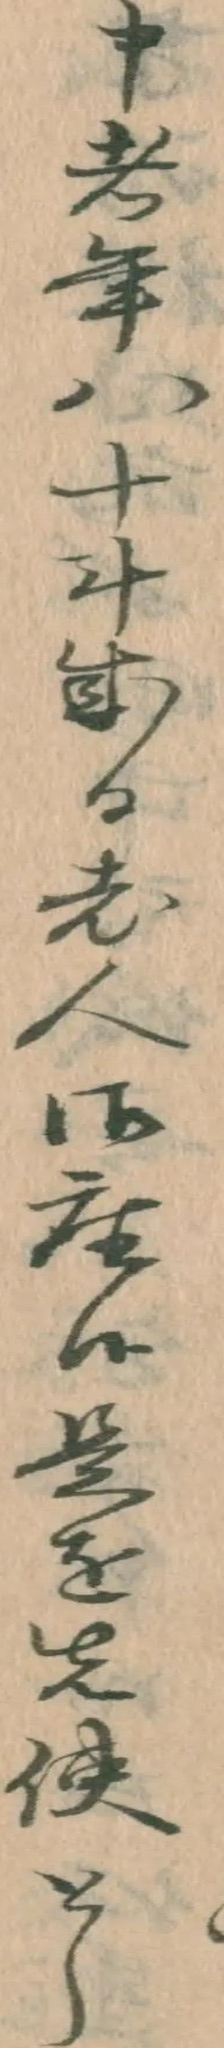申考年八十成る老人御座候是を先使とし
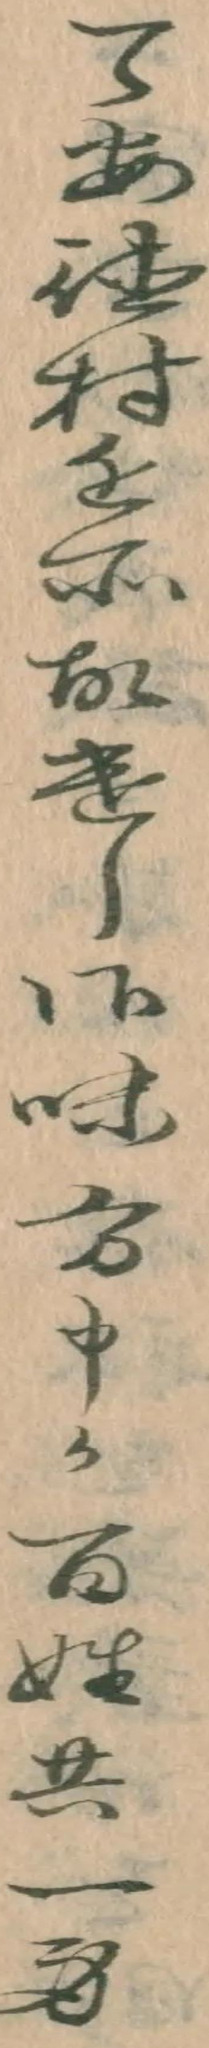て安徳村を所故遣し御味方申か百姓共一身
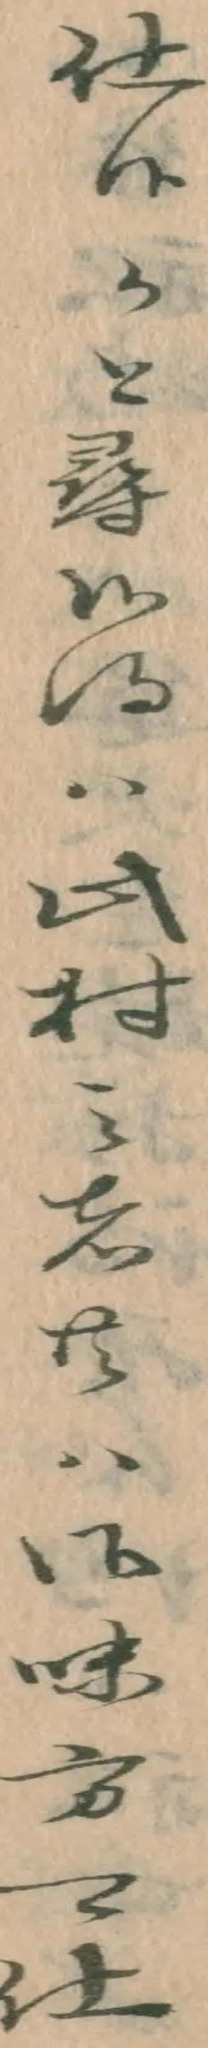仕候かと尋候得は此村之者共は御味方可仕
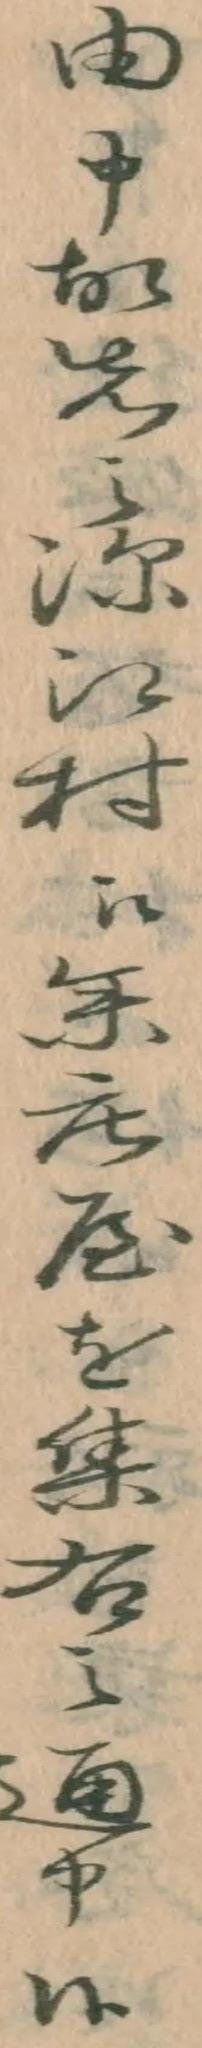由申故先之深江村え参庄屋を集右之通申候
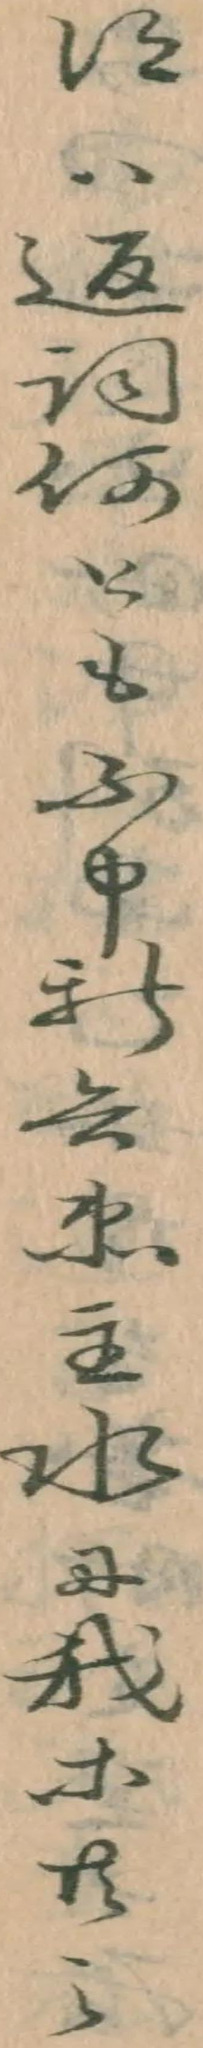得は返詞何とも不申新兵衛主水に我等共之
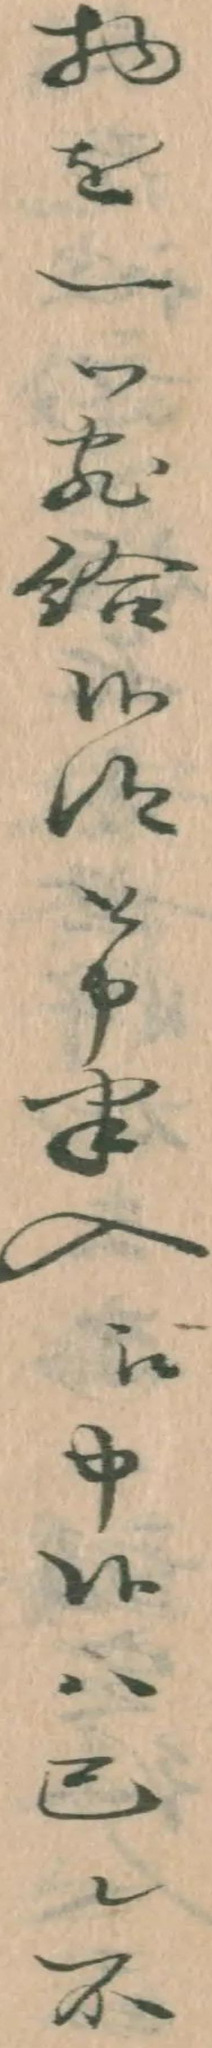物を一つ宛給候得と申半入え申候は己れ不
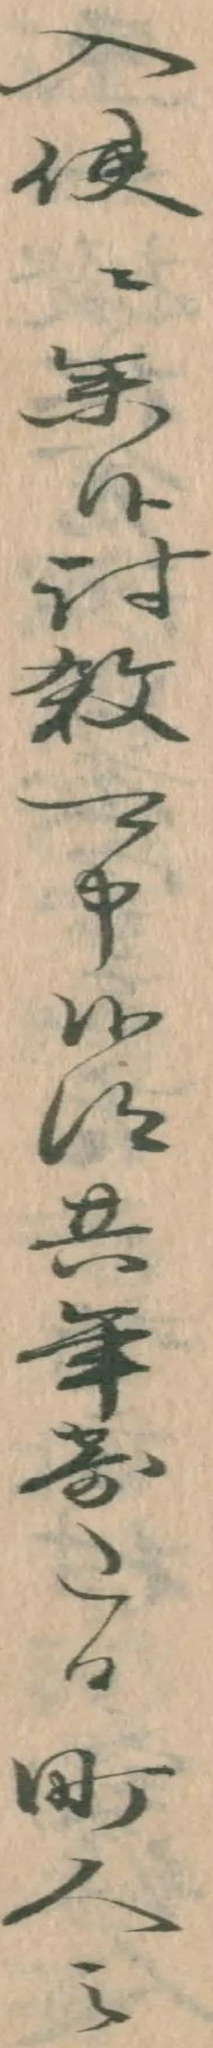入使に参候討殺可申候得共年寄たる町人之
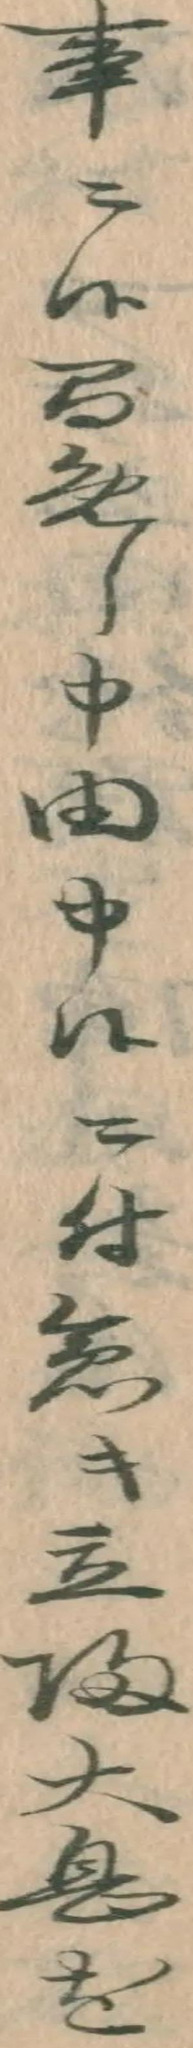事に候間免し申由申候に付急き立帰大息を
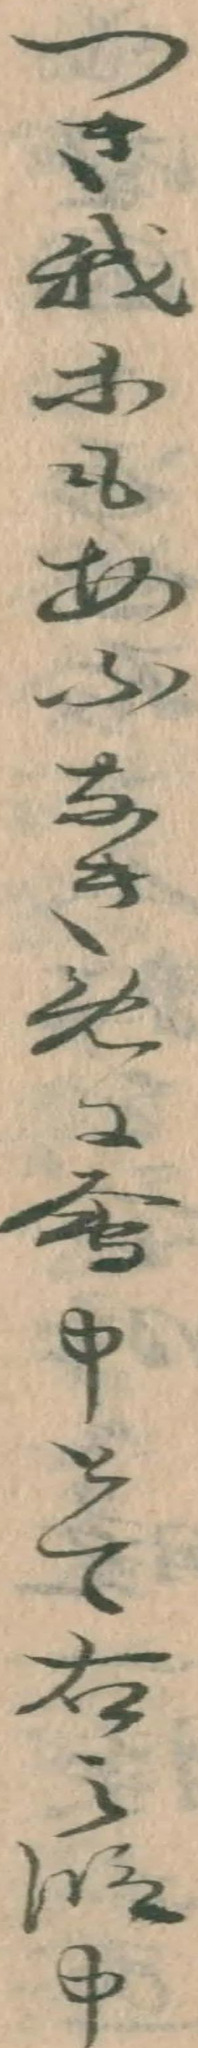つき我等もあふなきめに会申とて右之段申
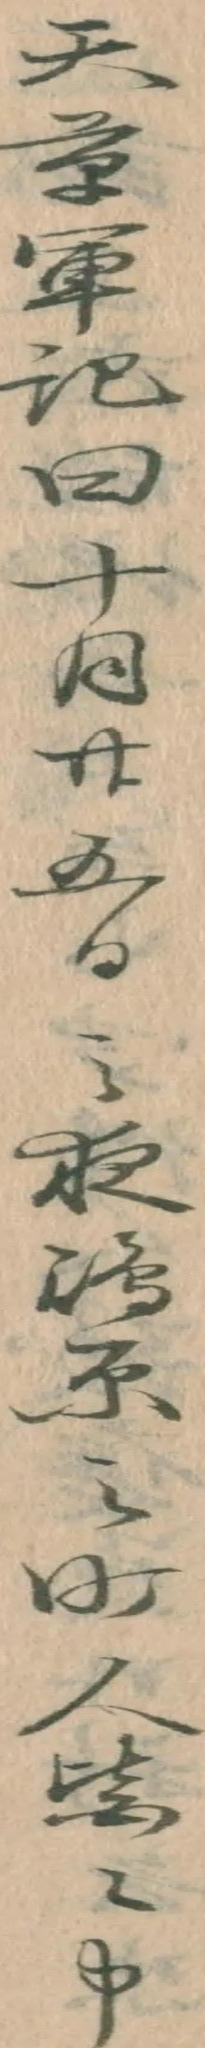天草軍記日十月廿五日之夜島原之町人皆々申
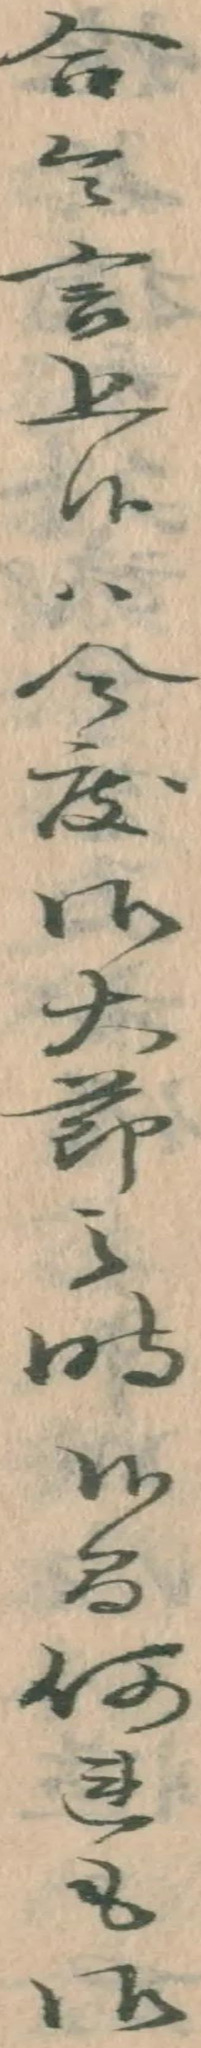合令言上候は今度御大節之時候間何れも御
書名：切支丹御退治記 49巻. [1]
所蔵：国立国会図書館 National Diet Library, JAPAN
